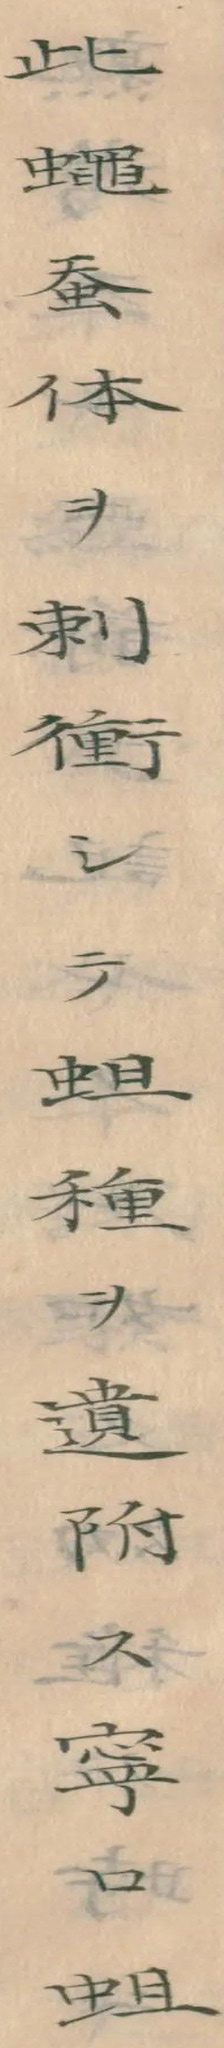此蝿蚕体ヲ刺衝シテ蛆種ヲ遺附ス寧ロ蛆
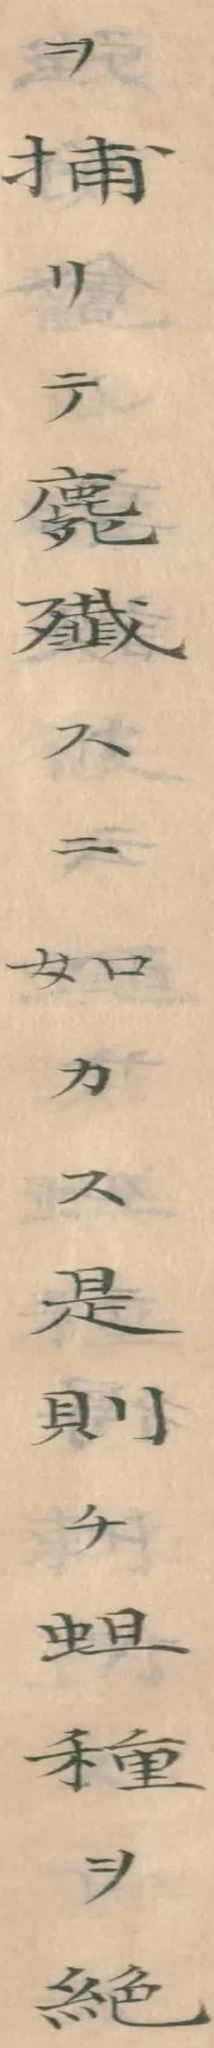ヲ捕リテ殲スニ如カス是則チ蛆種ヲ絶
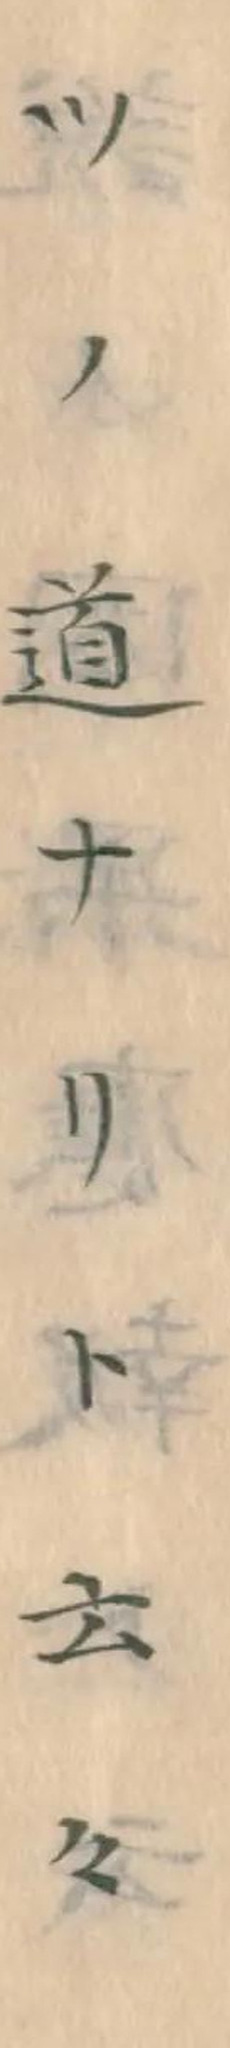ツノ道ナリト云々
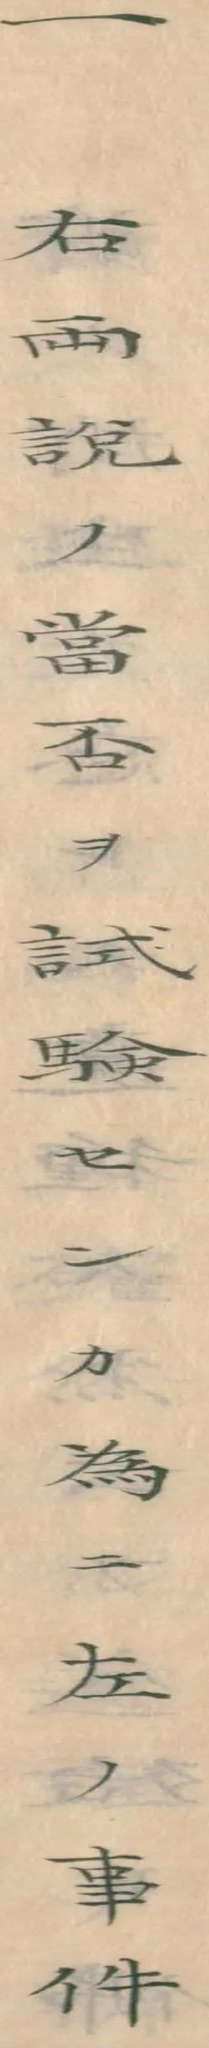一右両説ノ当否ヲ試験センカ為ニ左ノ事件
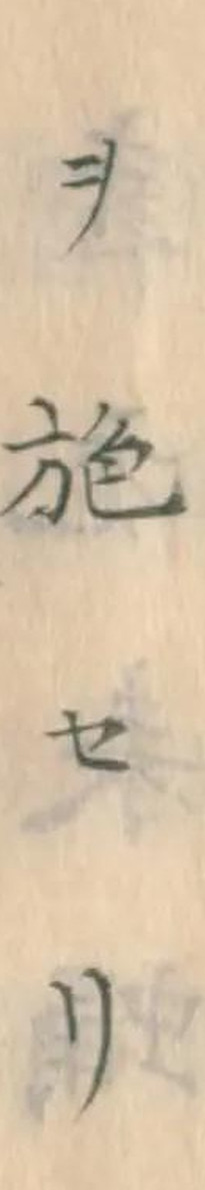ヲ施セリ
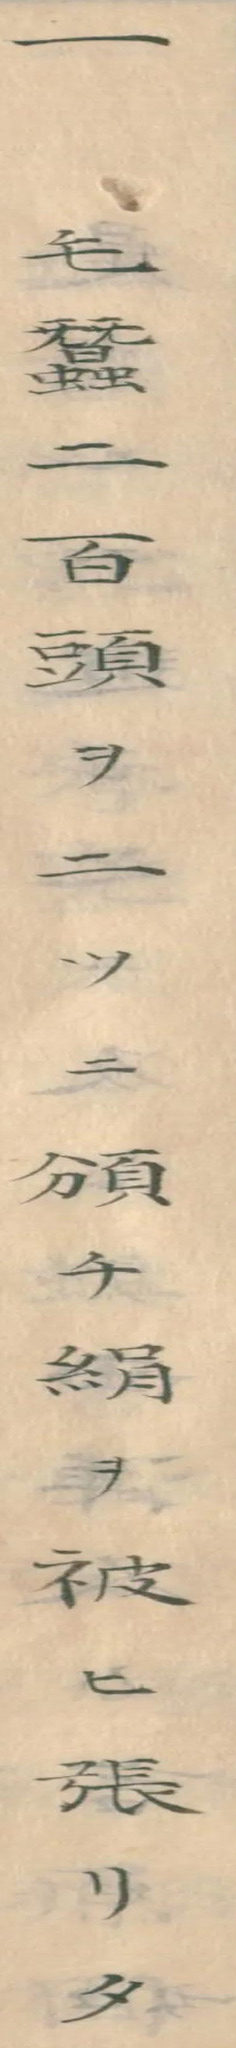一毛蚕二百頭ヲ二ツニ頒チ絹ヲ被ヒ張リタ
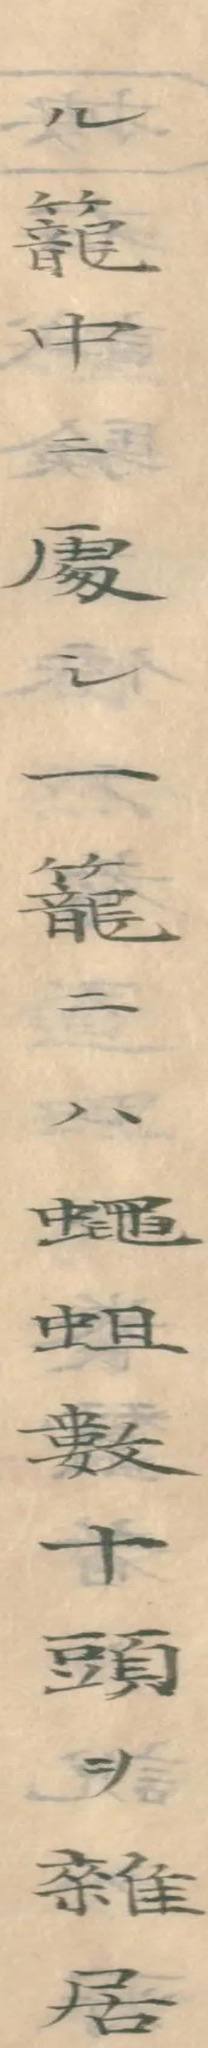ル籠中ニ処シ一籠ニハ蝿蛆数十頭ヲ雑居
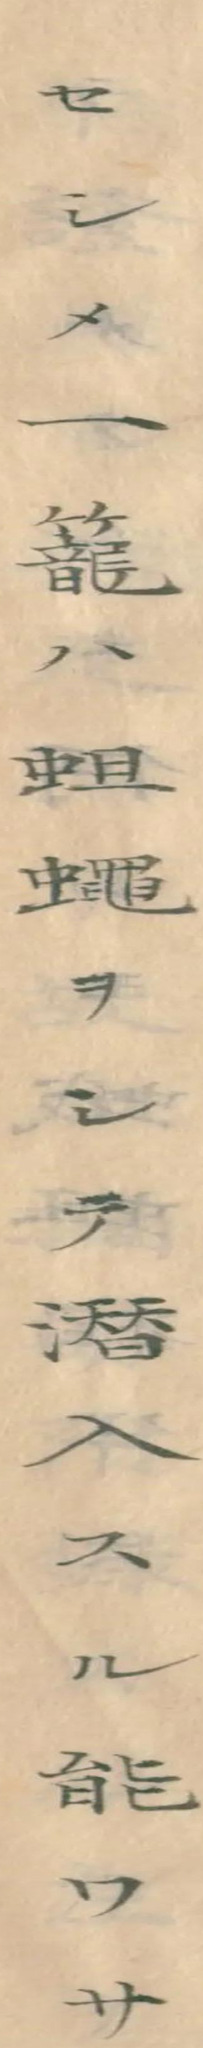セシメ一籠ハ蛆蝿ヲシテ潜入スル能ワサ

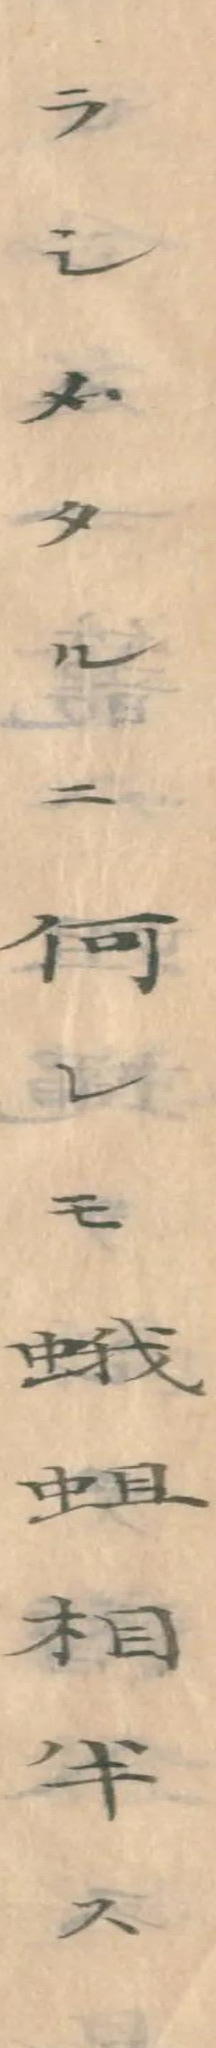ラシメタルニ何レモ蛾蛆相半ス
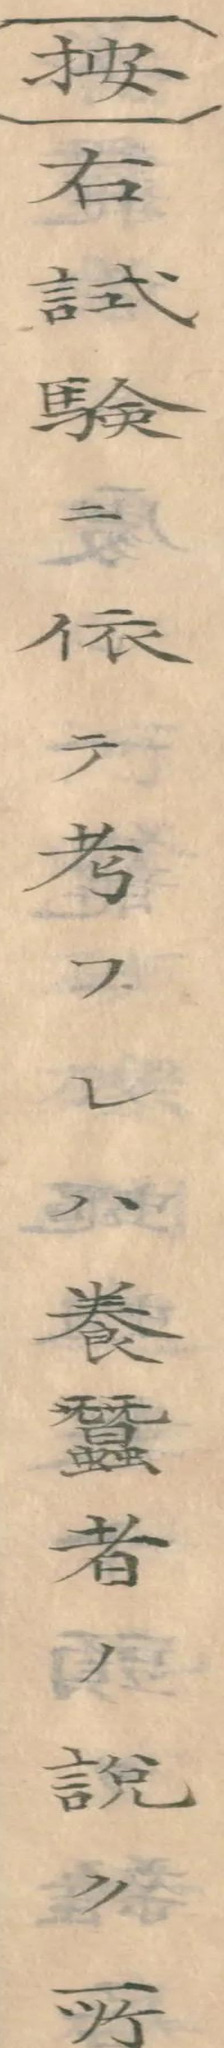一[按]右試験ニ依テ考フレハ養蚕者ノ説ク所
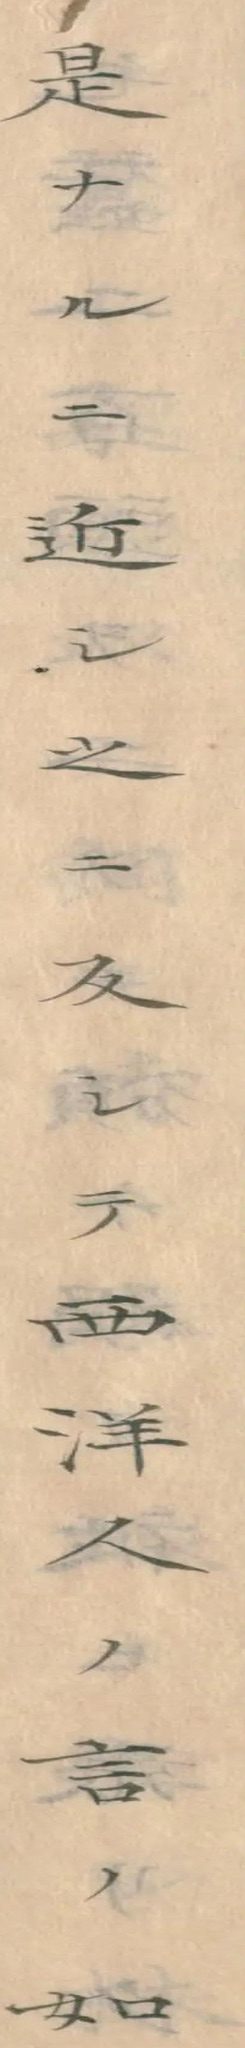是ナルニ近シ之ニ反シテ西洋人ノ言ノ如
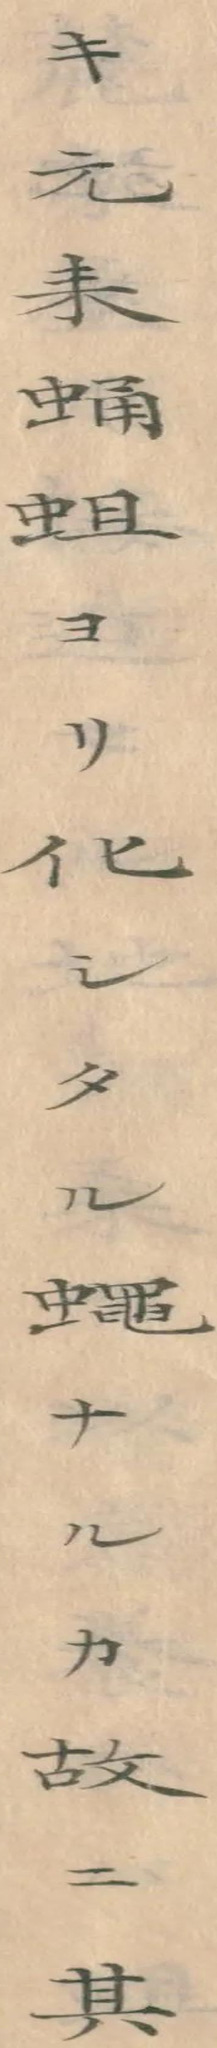キ元来蛹蛆ヨリ化シタル蝿ナルカ故ニ其
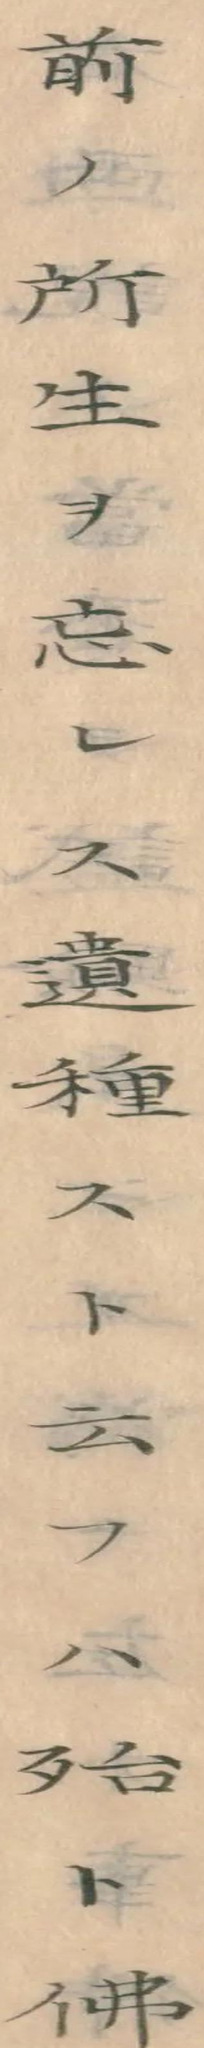前ノ所生ヲ忘レス遺種スト云フハ殆ト仏
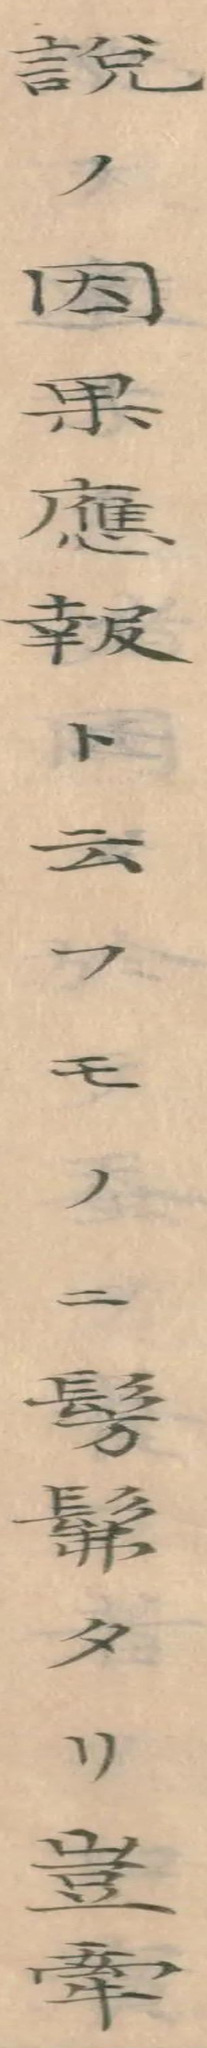説ノ因果応報ト云フモノニ髣髴タリ豈牽
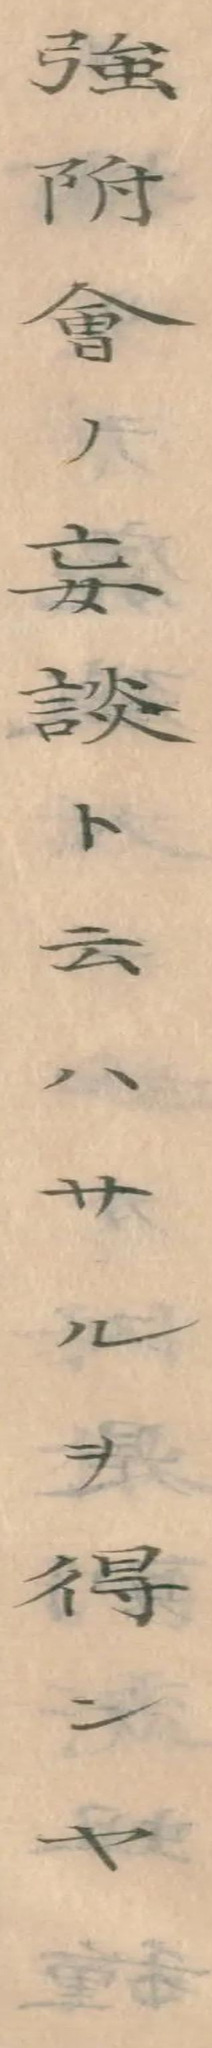強附会ノ妄談ト云ハサルヲ得ンヤ
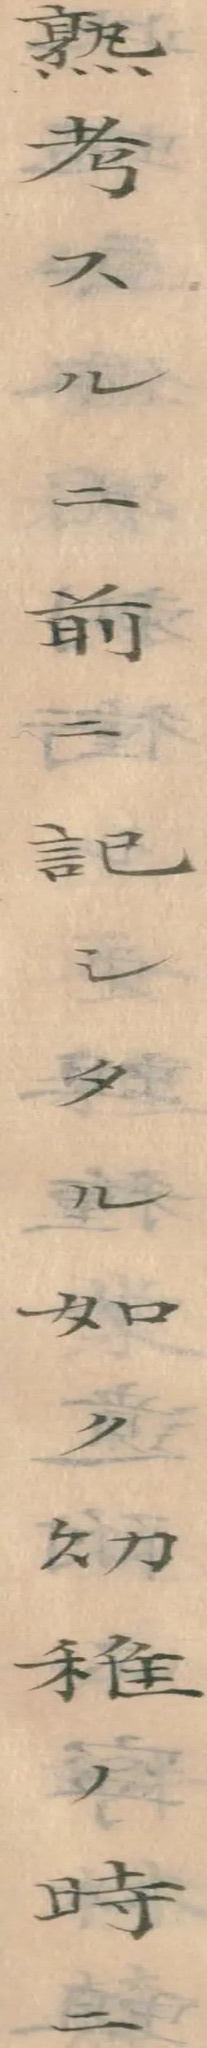熟考スルニ前ニ記シタル如ク幼稚ノ時ニ
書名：蚕桑集成
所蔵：国立国会図書館 National Diet Library, JAPAN
